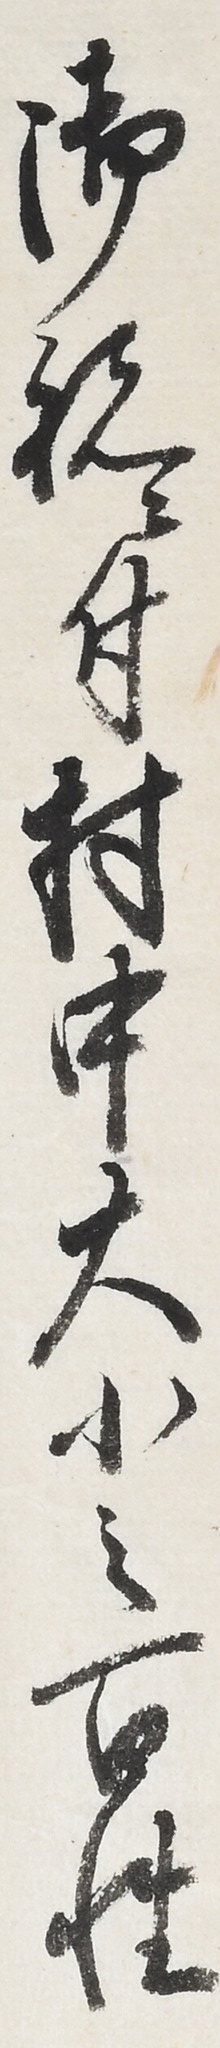御祝ニ付村中大小之百姓
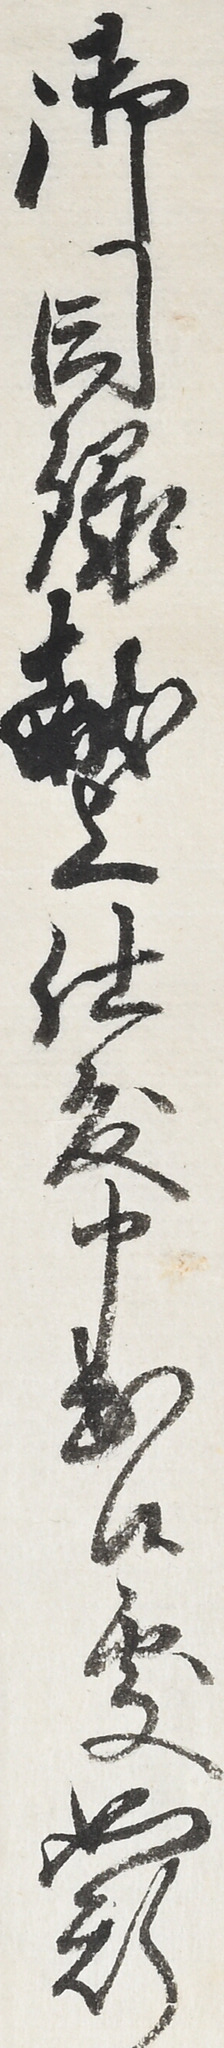御目録献上仕度申出候処如斯
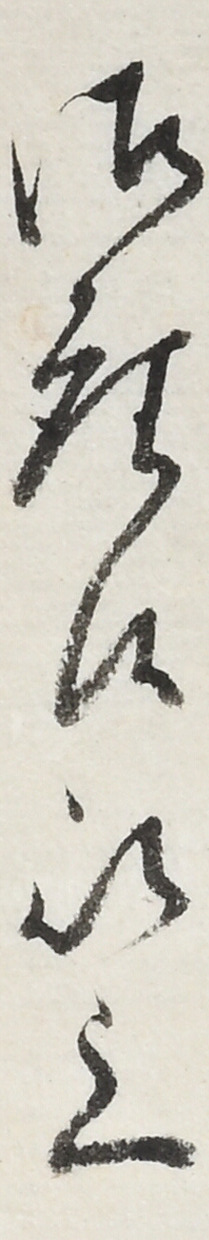御座候以上

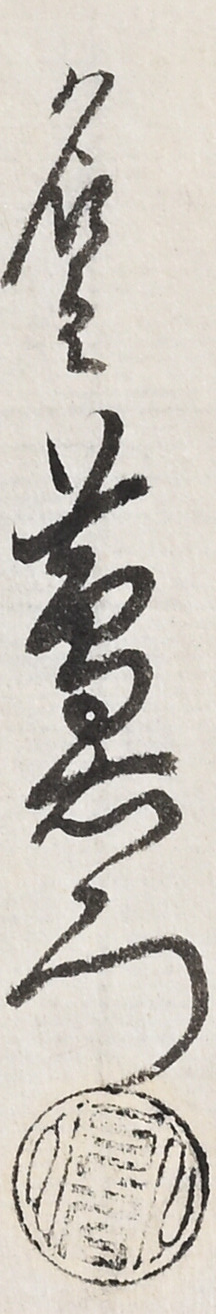名主蔦右衛門㊞
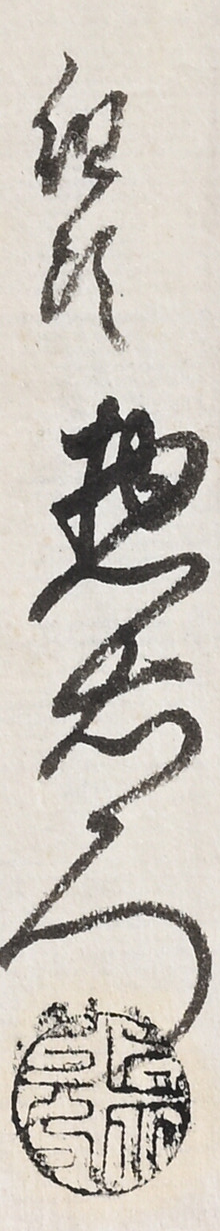組頭惣右衛門㊞
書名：御拝地百五拾年御祝儀献上御目録名前
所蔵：伊那市立高遠町図書館・合同会社AMANE
